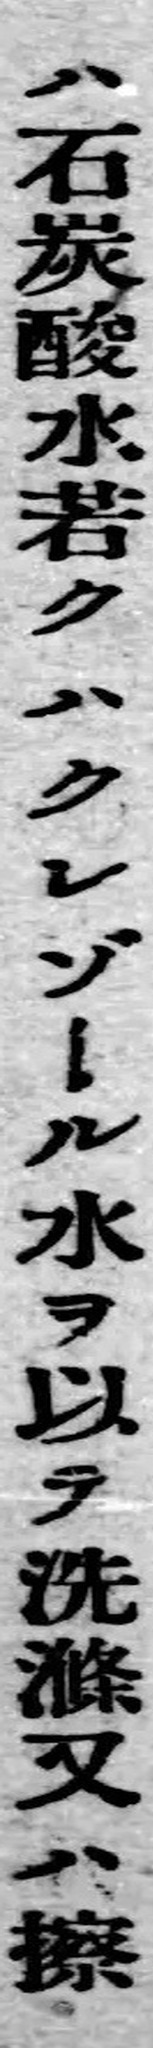ハ石炭酸水若クハクレゾール水ヲ以テ洗滌又ハ擦
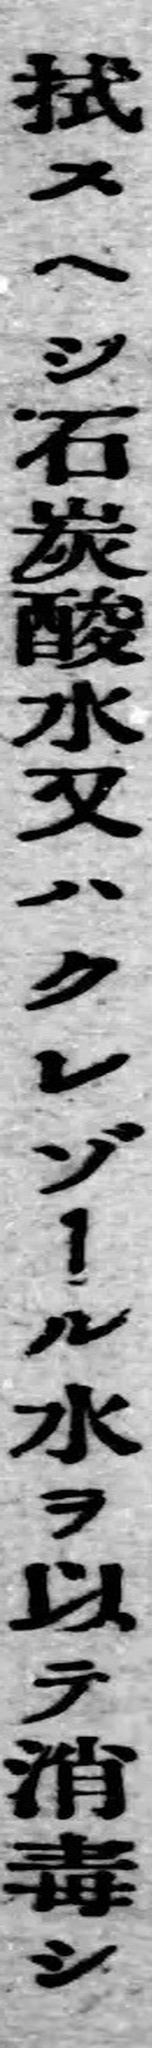拭スヘシ石炭酸水又ハクレゾール水ヲ以テ消毒シ

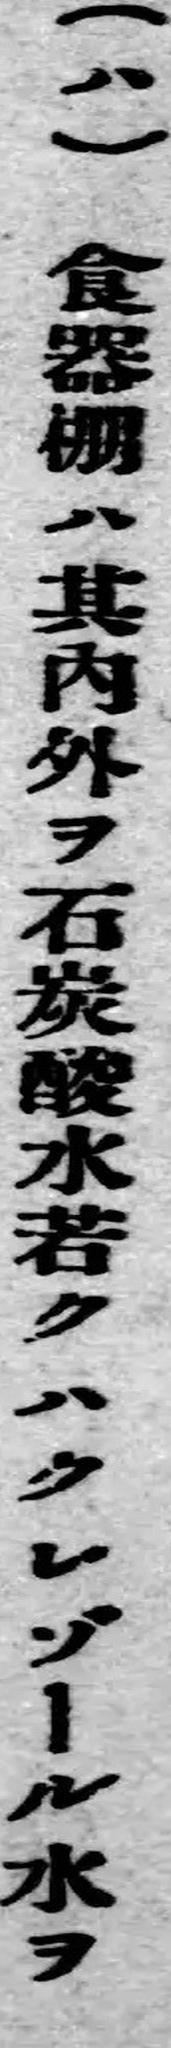(ハ)食器棚ハ其内外ヲ石炭酸水若クハクレゾール水ヲ
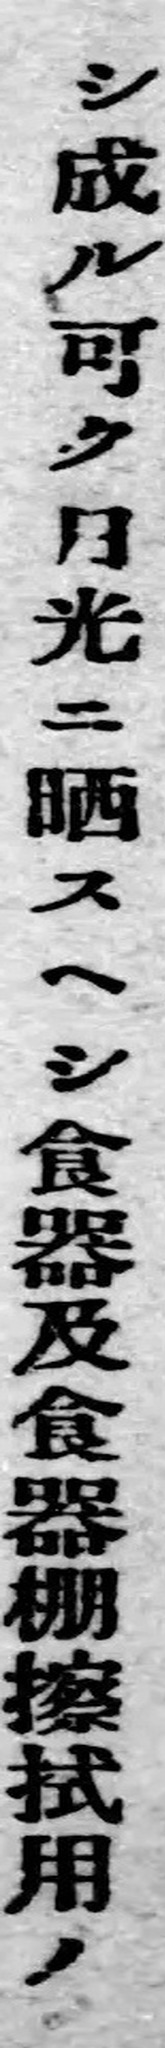シ成ル可ク日光ニ晒スヘシ食器及食器棚擦拭用ノ
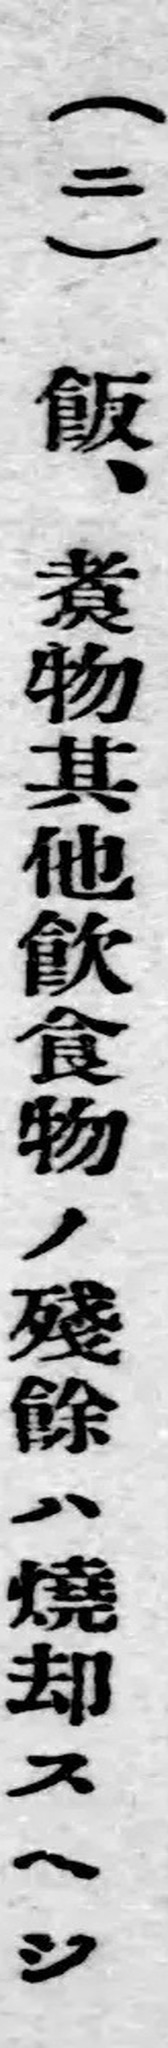(ニ)飯、煑物其他飮食物ノ殘餘ハ燒却スヘシ
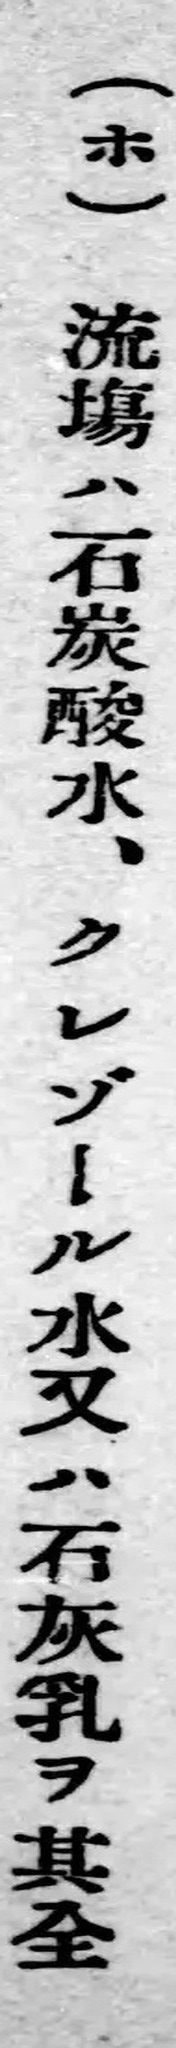(ホ)流塲ハ石炭酸水、クレゾール水又ハ石灰乳ヲ其全
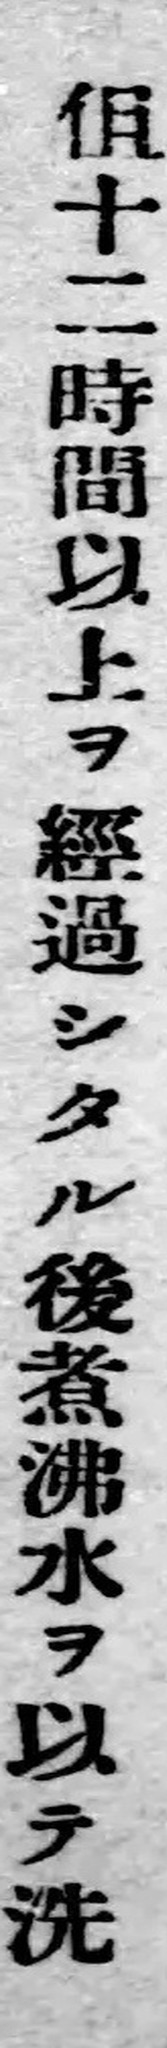但十二時間以上ヲ經過シタル後煮沸水ヲ以テ洗
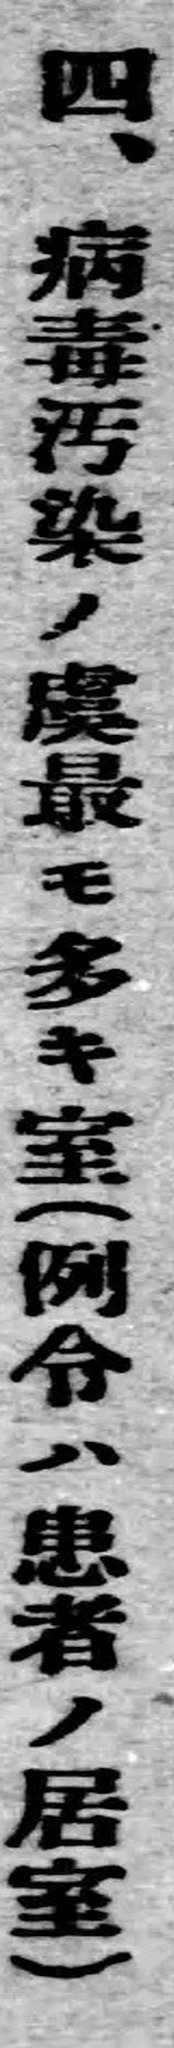四、病毒汚染ノ虞最モ多キ室(例令ハ患者ノ居室)
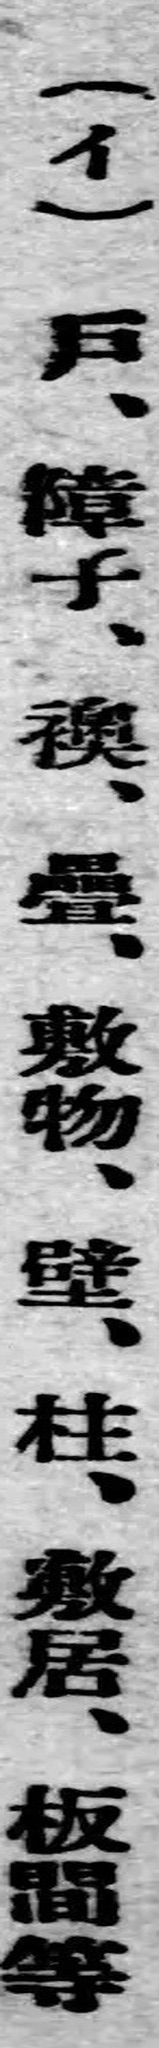(イ)戸、障子、襖、疊、敷物、壁、柱、敷居、板間等
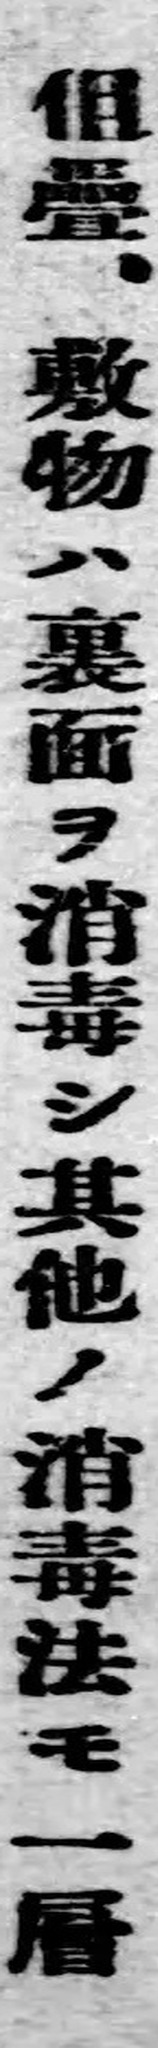但疊、敷物ハ裏面ヲ消毒シ其他ノ消毒法モ一層
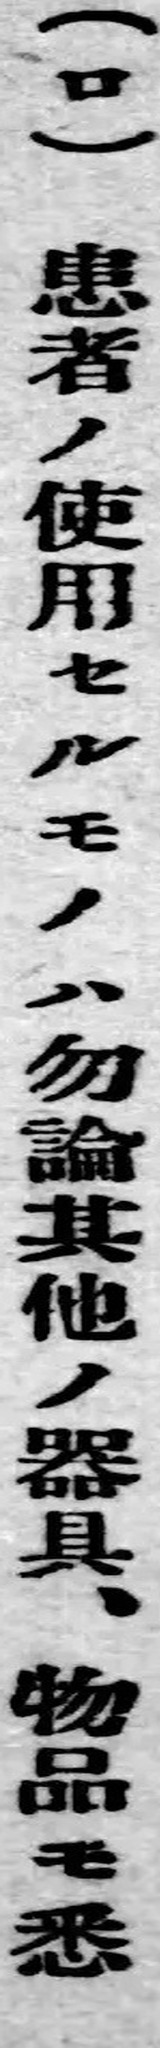(ロ)患者ノ使用セルモノハ勿論其他ノ器具、物品モ悉
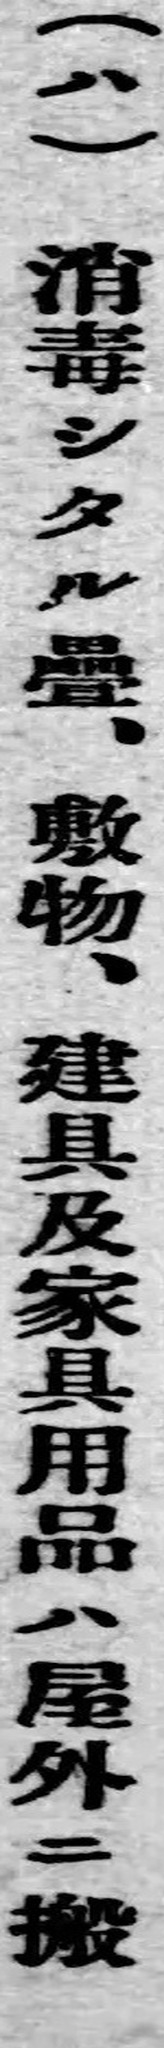(ハ)消毒シタル疊、敷物、建具及家具用品ハ屋外ニ搬
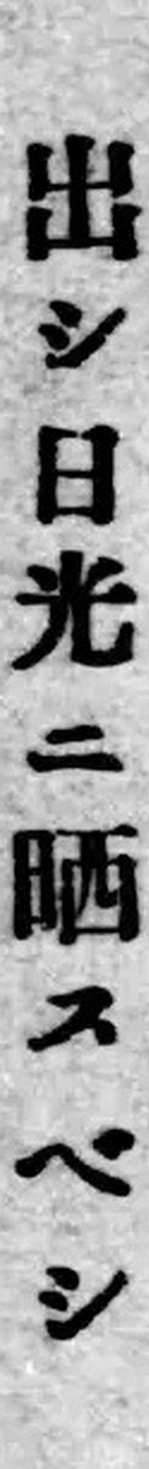出シ日光ニ晒スベシ
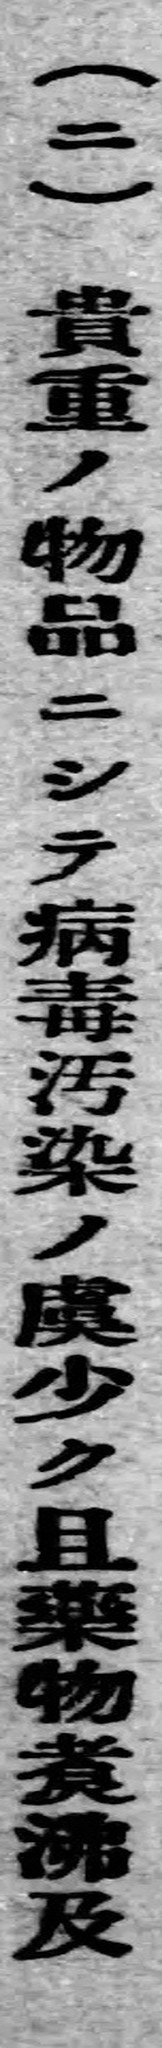(ニ)貴重ノ物品ニシテ病毒汚染ノ虞少ク且藥物煑沸及

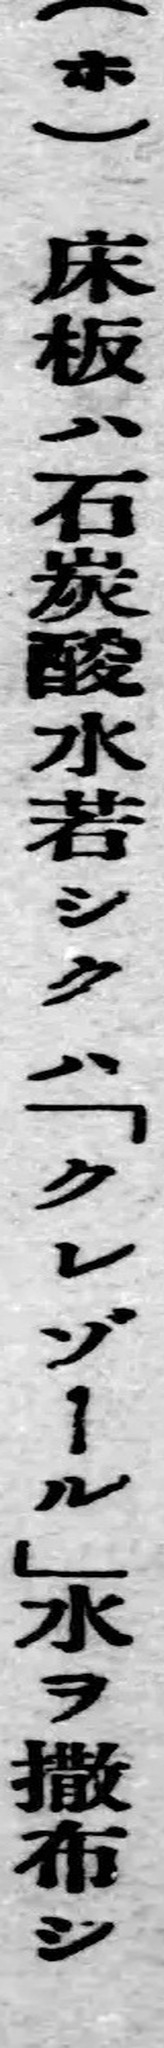(ホ)床板ハ石炭酸水若シクハ「クレゾール」水ヲ撒布シ
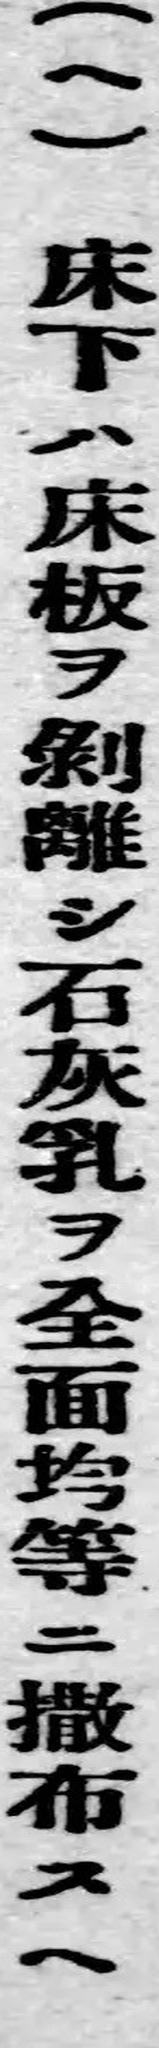(ヘ)床下ハ床板ヲ剝離シ石灰乳ヲ全面均等ニ散布スヘ
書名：袖珍防疫必携
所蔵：国立国会図書館 National Diet Library, JAPAN
